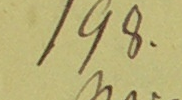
198
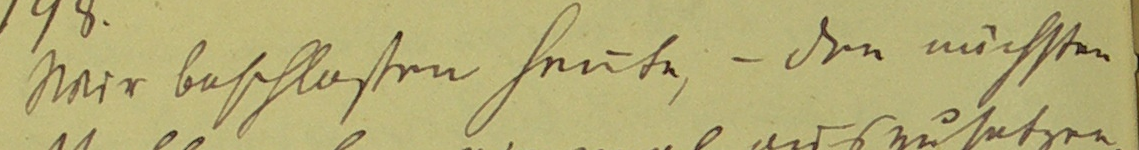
Wir beschlossen –den nächsten
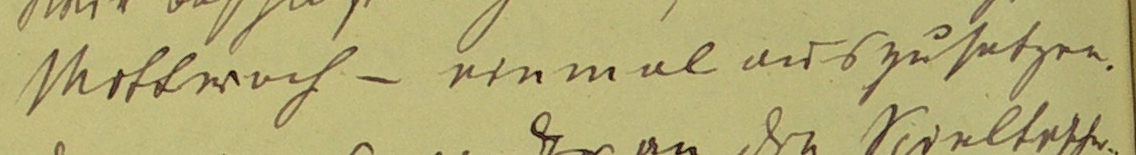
Mittwoch –einmal auszusetzten.
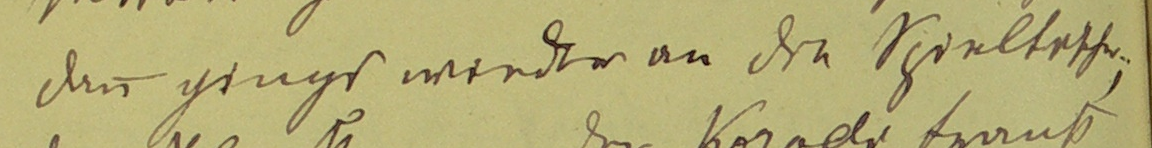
Dann gings wieder an den Spieltisch,
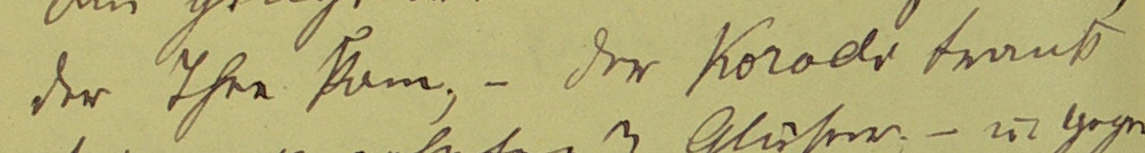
der Thee kam;- der Korodi trank
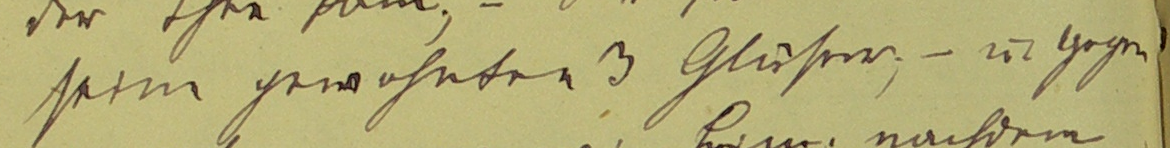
seine gewohnten 3 Gläser;- und gegen
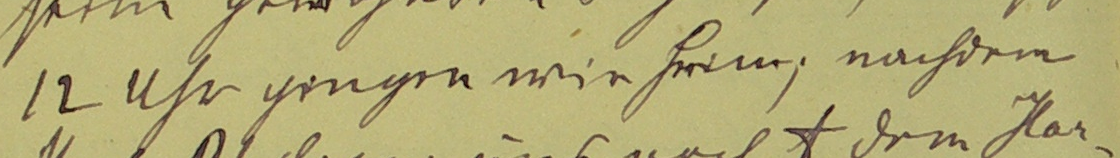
12 Uhr gingen wir heim. Nachdem
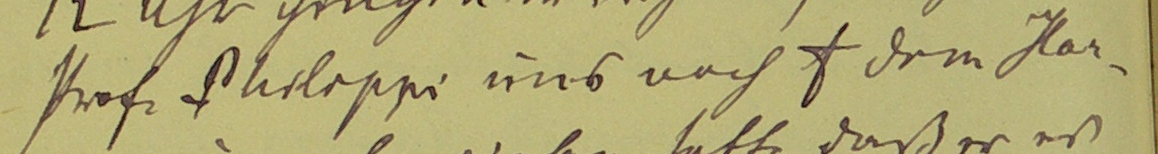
Prof. Philippi uns noch mit dem Har¬
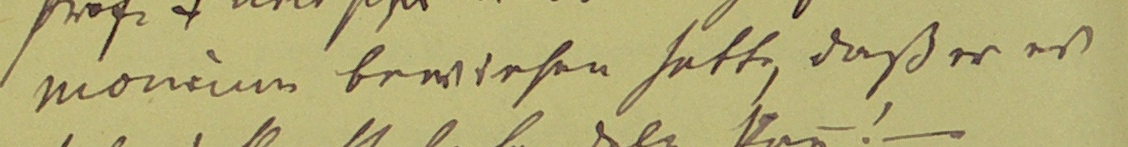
monium bewiesen hatte , daß er es
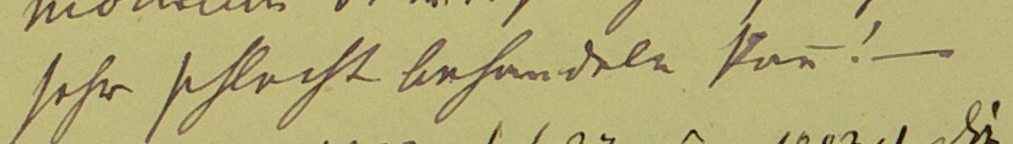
sehr schlecht behandeln kann ! -
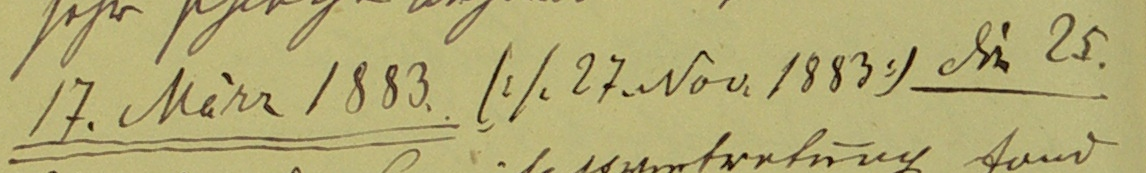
17 März 1883 ( : 27 Nov.!883: ) die 25
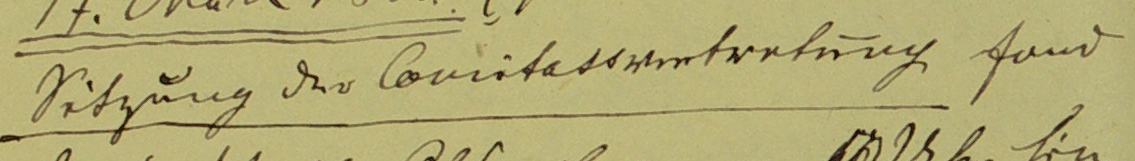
Sitzung der Comitatasvertretung fand
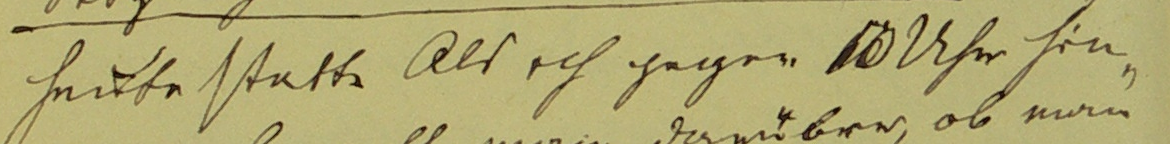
heute statt. Als ich gegen 10 Uhr hin¬
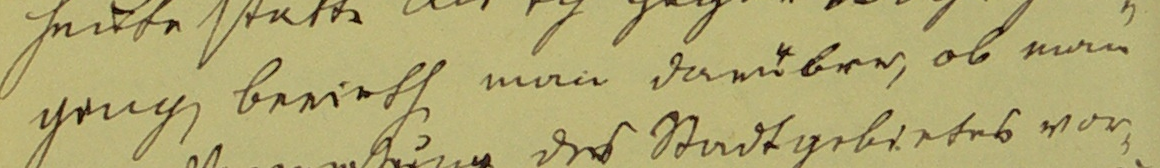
ging, beriet man darüber, ob man
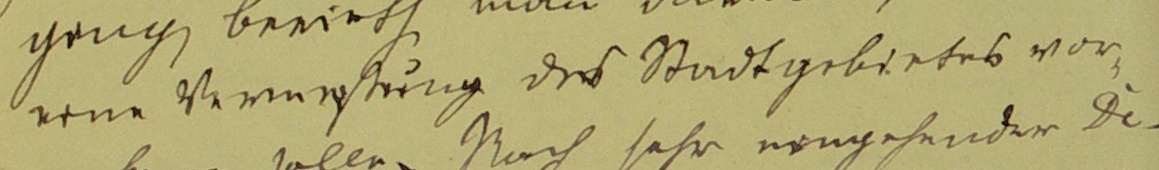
eine Vermessung des Stadtgebietes vor¬
